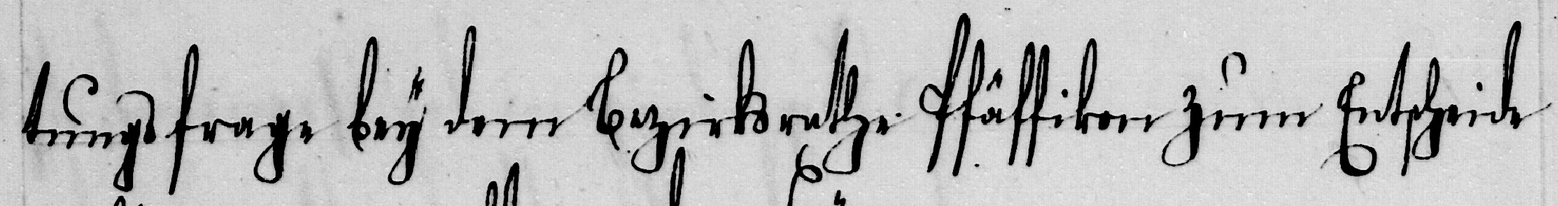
tungsfrage bey dem Bezirksrathe Pfäffikon zum Entscheid
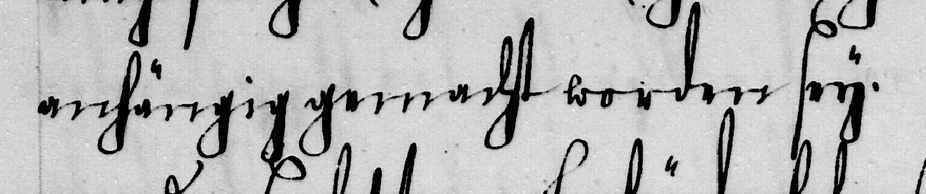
anhängig gemacht worden sey.
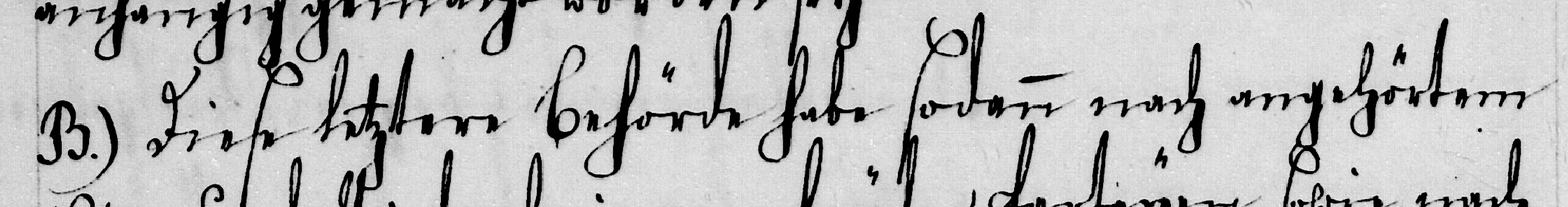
B.) Diese letztere Behörde habe sodann nach angehörtem
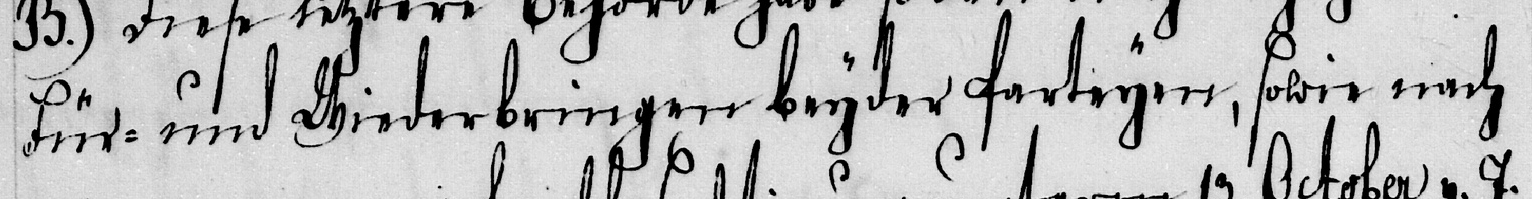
Für- und Wiederbringen beyder Parteyen, sowie nach
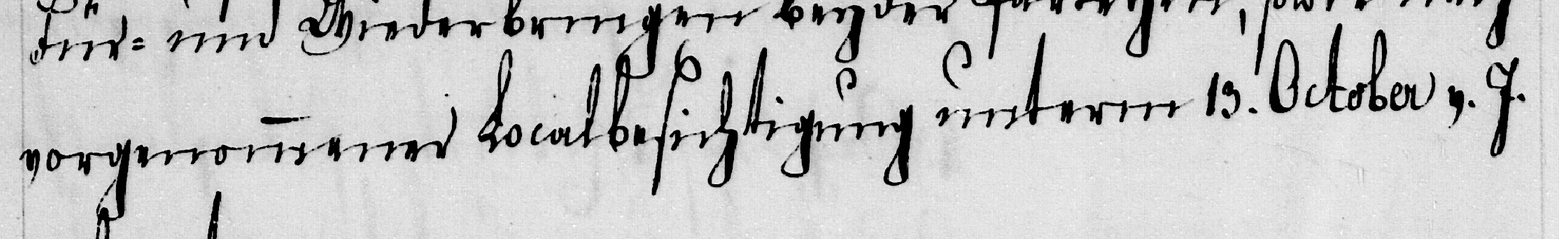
vorgenommener Localbesichtigung unterm 13. October v. J.
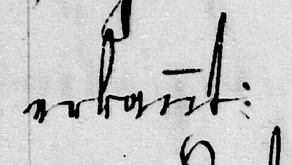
erkannt:
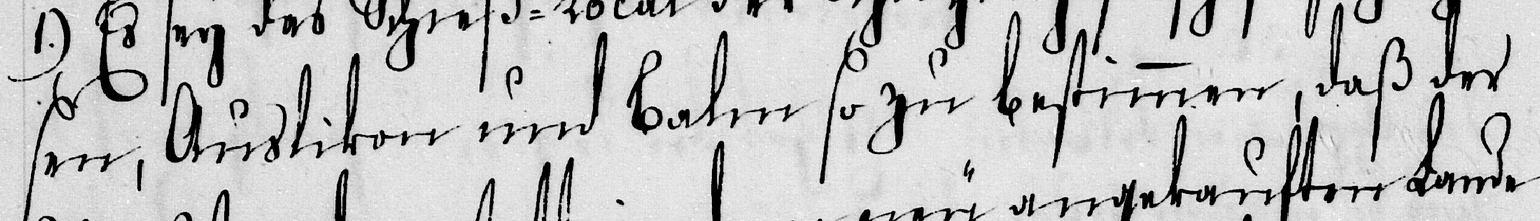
sen, Auslikon und Balm so zu bestimmen, daß der
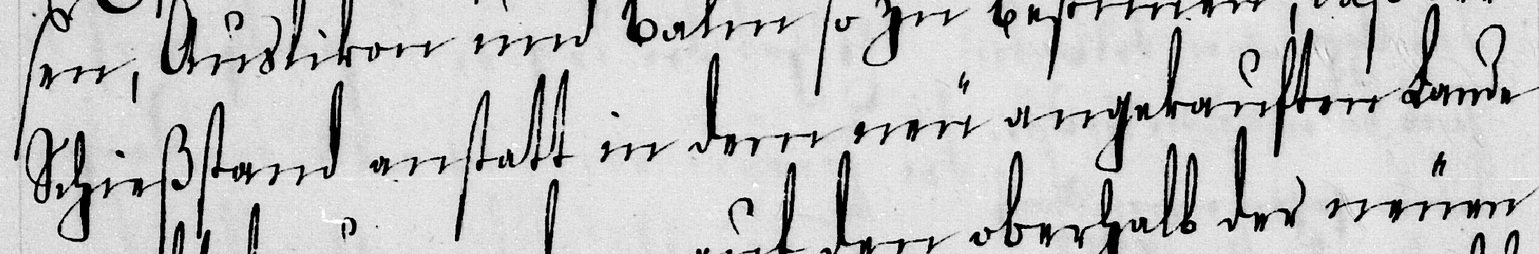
Schießstand anstatt in dem neu angekauften Lande
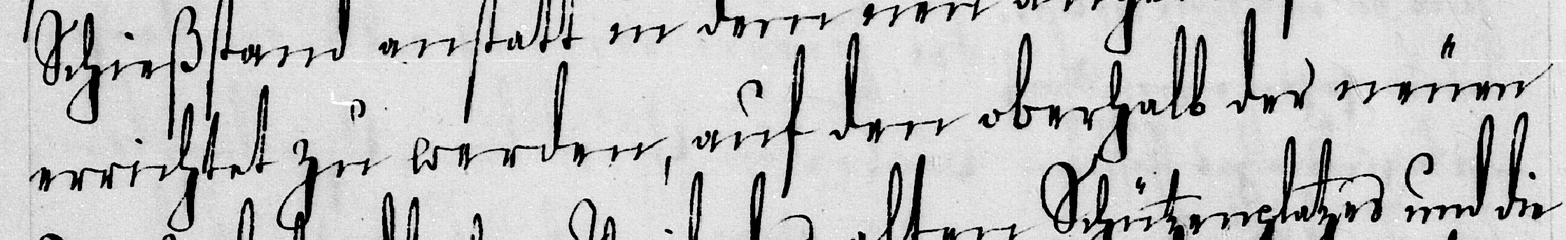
errichtet zu werden, auf den oberhalb der neuen
